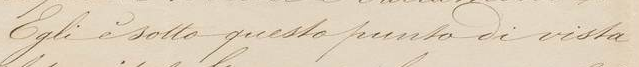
Egli è sotto questo punto di vista
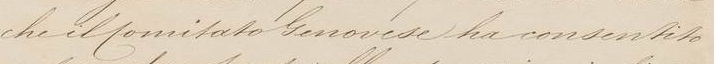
che il comitato Genovese ha consentito
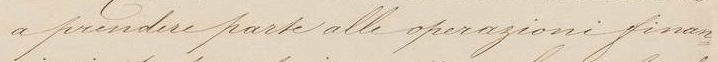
a prendere parte alle operazioni finan-
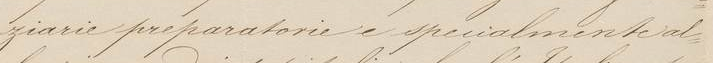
ziarie preparatorie e specialmente al-
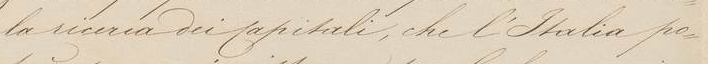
la ricerca dei capitali, che l'Italia po-
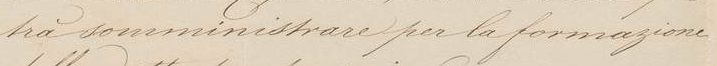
trà somministrare per la formazione
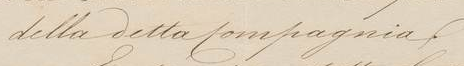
della detta compagnia.
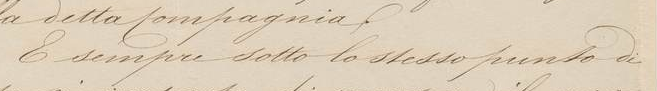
E sempre sotto lo stesso punto di
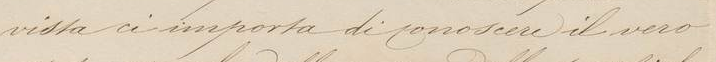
vista ci importa di conoscere il vero
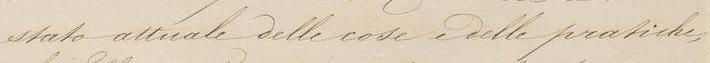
stato attuale delle cose e delle pratiche,
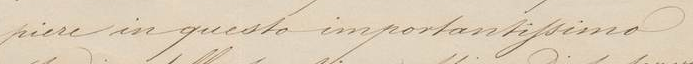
piere in questo importantissimo
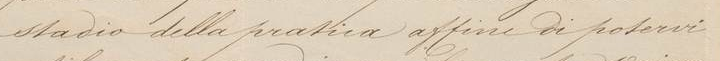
stadio della pratica affine di potervi
